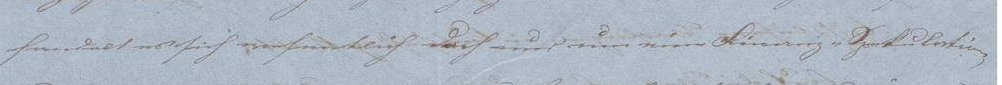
handelt es sich wesentlich doch nur um eine Finanz-Spekulation,
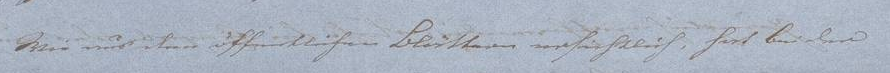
Wie aus den öffentlichen Blättern ersichtlich, hat bei der
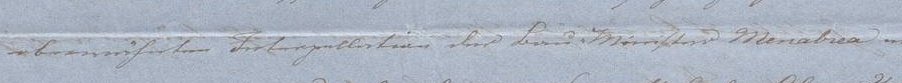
oberwähnten Interpellation der Bau-Minister Menabrea eine
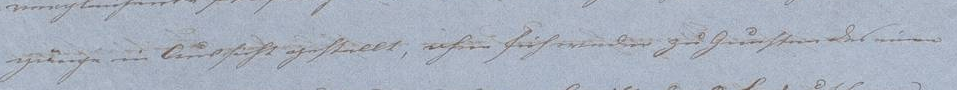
gänge in Aussicht gestellt, ohne sich weder zu Gunsten des einen
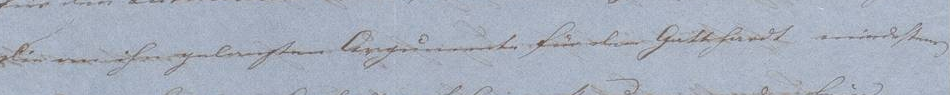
die an ihn gelangten Argumente für den Gotthardt mindestens
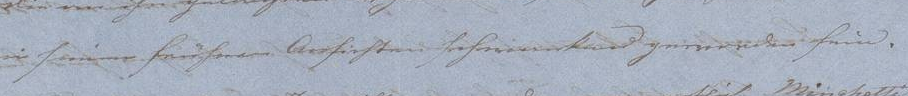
in seinen frühern Ansichten schwankend geworden sein.
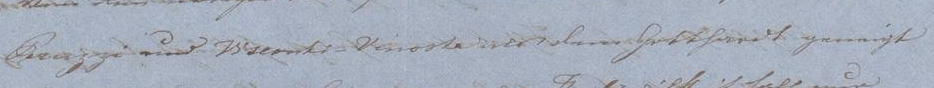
Perazzi und Visconti-Vinosta als dem Gotthardt geneigt
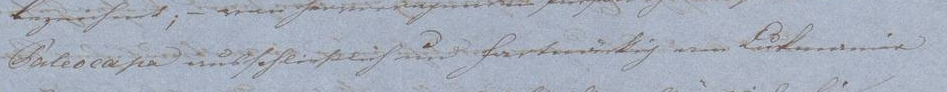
Paleocapa ausschließlich und hartnäckig am Lukmanier
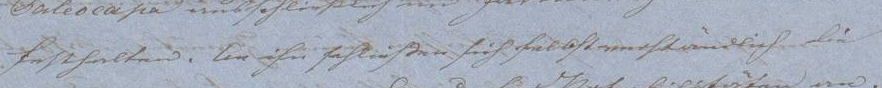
festhalten. An ihn schließen sich selbstverständlich die
